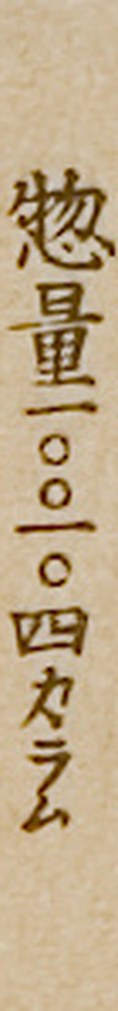惣量一〇〇一〇四カラム
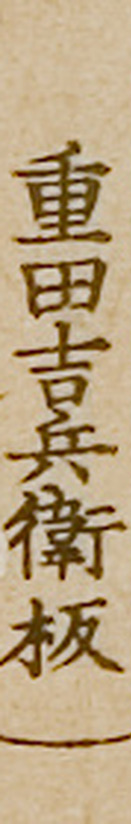重田吉兵衛板
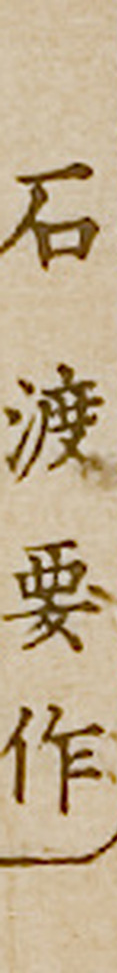石渡要作
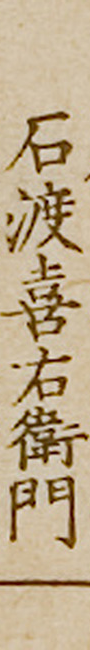石渡喜右衛門
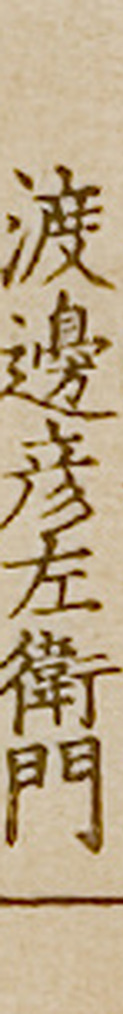渡邊彦左衛門
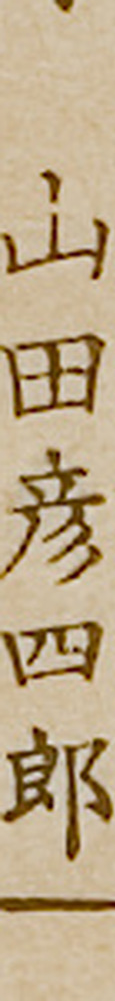山田彦四郎
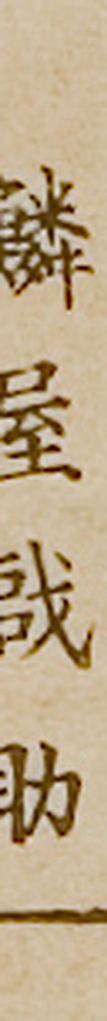鱗屋啓助
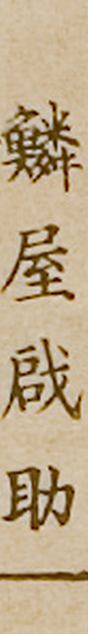鱗屋啓助
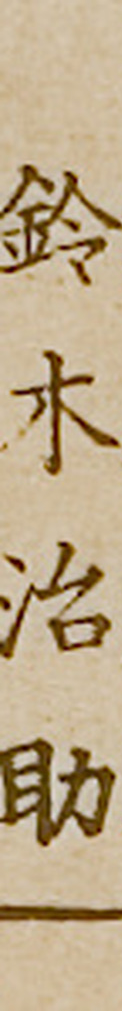鈴木治助
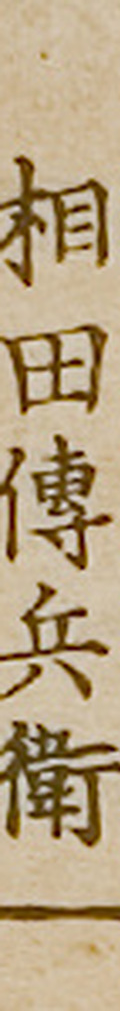相田伝兵衛
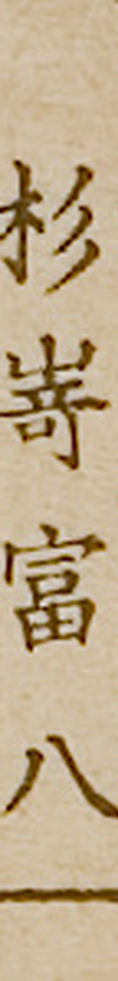杉﨑富八
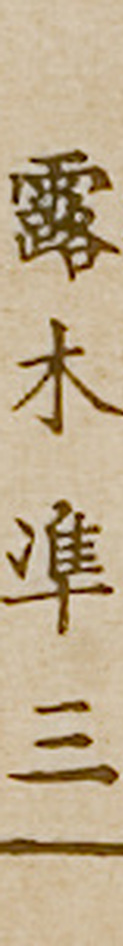露木準三
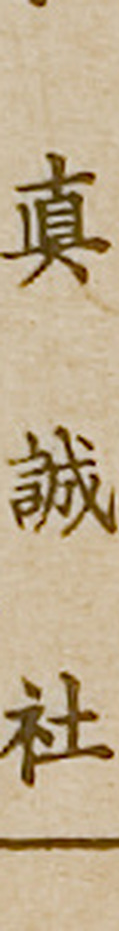真誠社
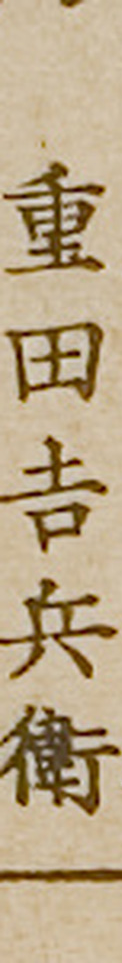重田吉兵衛
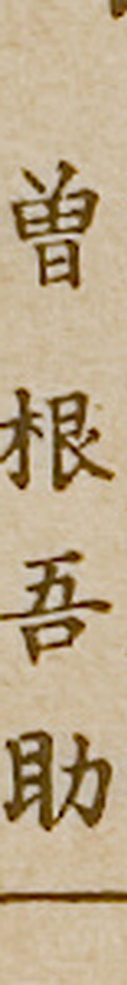曽根吾助
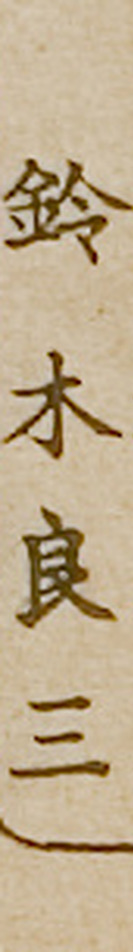鈴木良三
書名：熱海温泉沸騰之図
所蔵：東京大学総合図書館 General Library in the University of Tokyo, JAPAN
